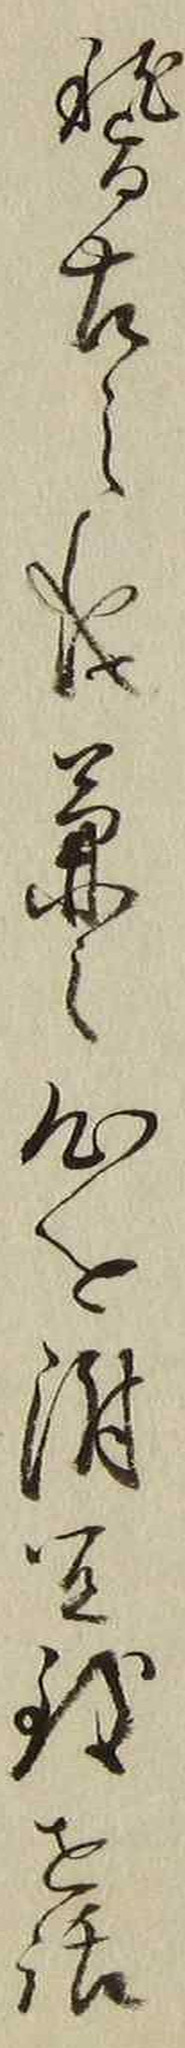稽古之儀兼々心を付宜致世話
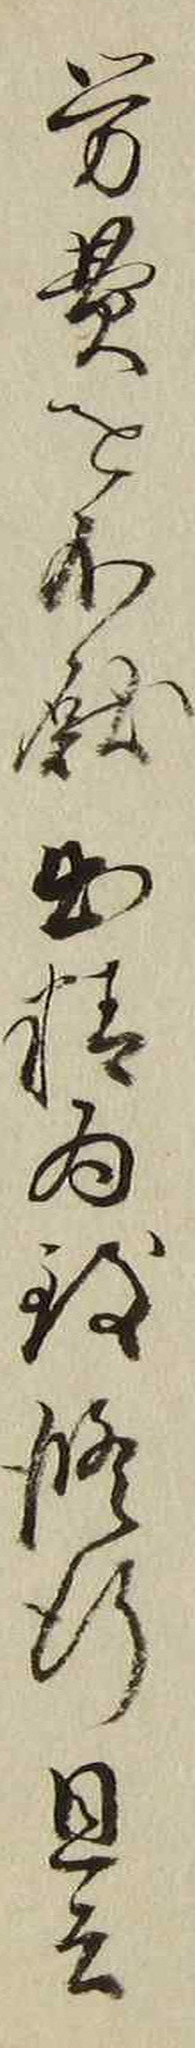労費を不厭出精為致修行且去
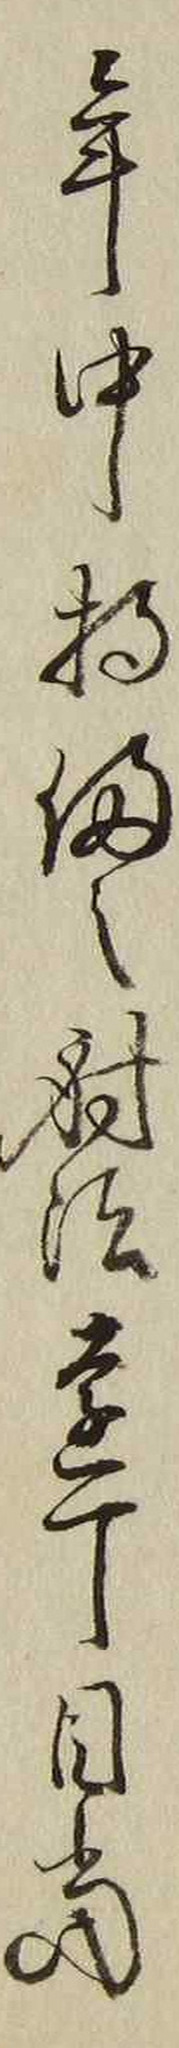年中持備之射法遠丁目当
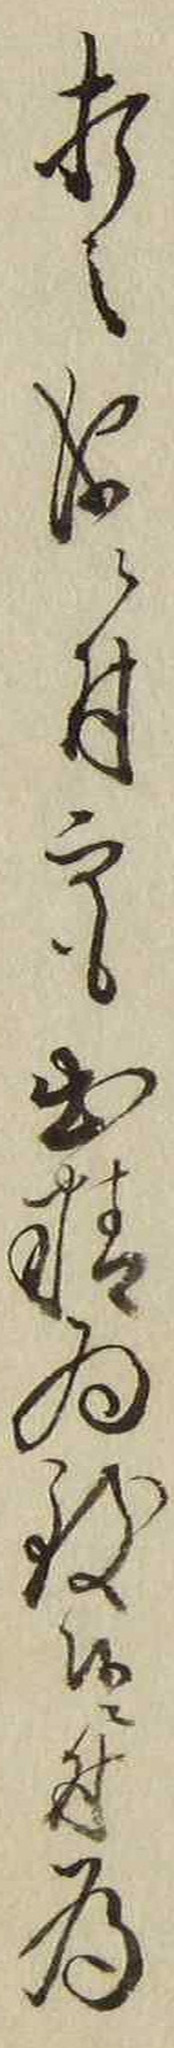打之儀ニ付而も出精為致候ニ付為

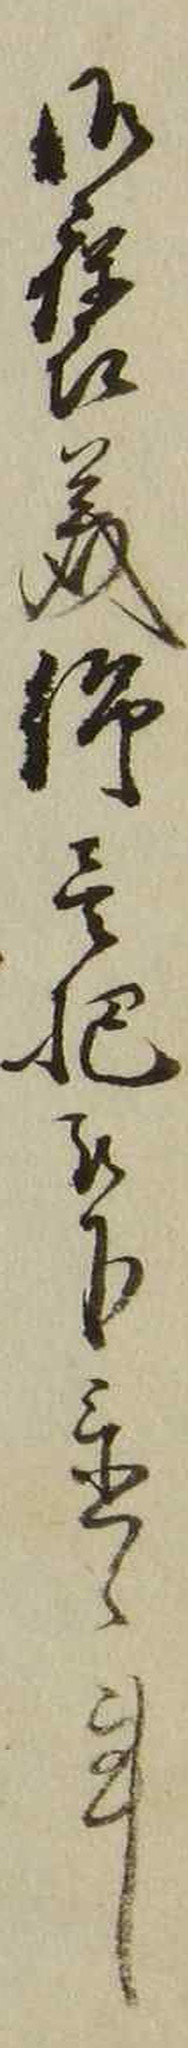御褒美綿壱把被下置候事
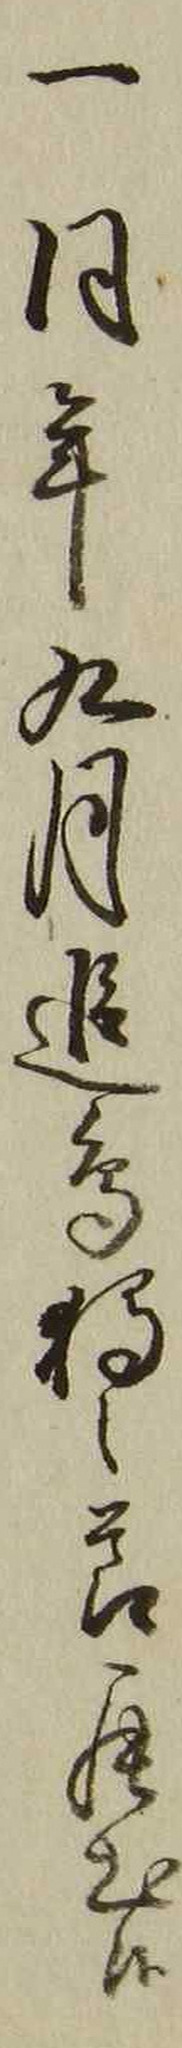一同年九月追鳥狩之節罷出候
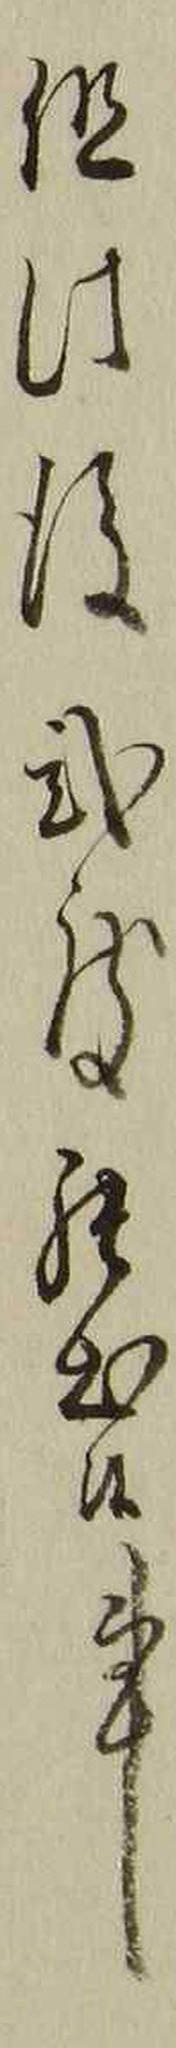但此後弐度罷出候事
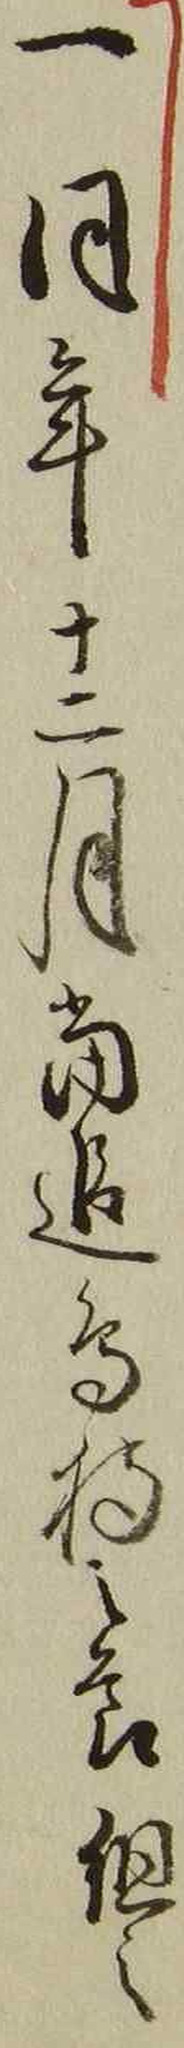一同年十二月当追鳥狩之節組之
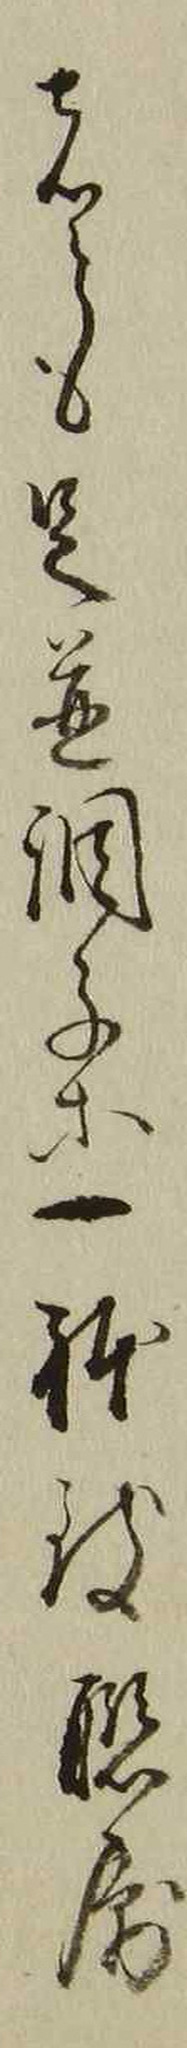者とも足並調子等一体致聯属
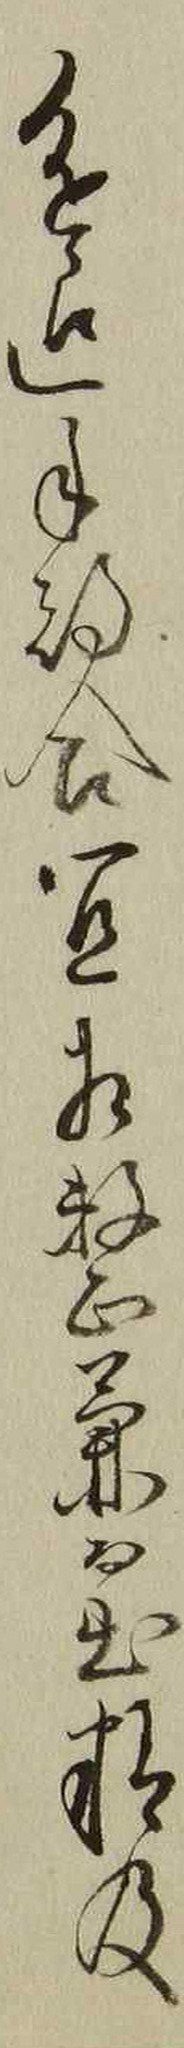進退手都合宜相整兼而出精及
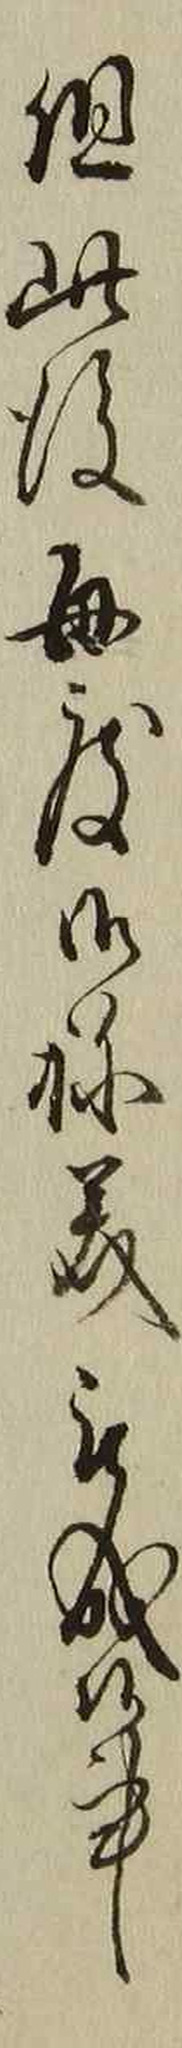但此後毎度御称美被成候事
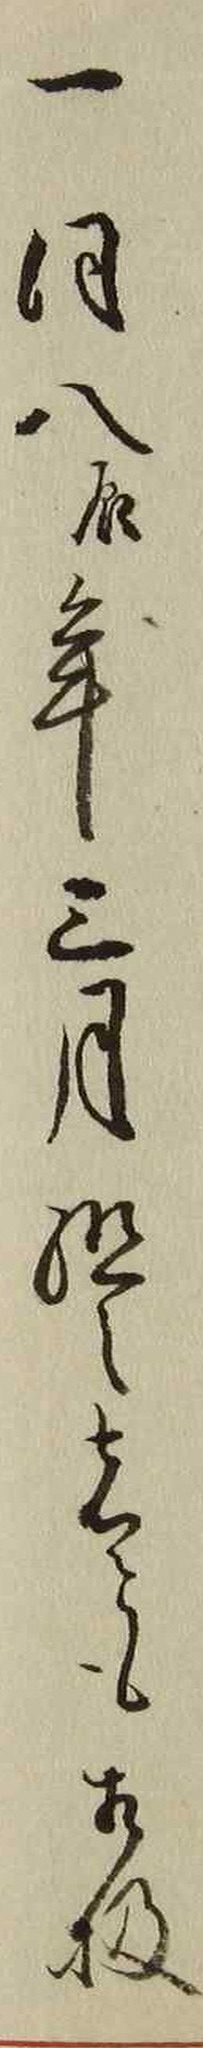一同八辰年三月組之者とも相扱
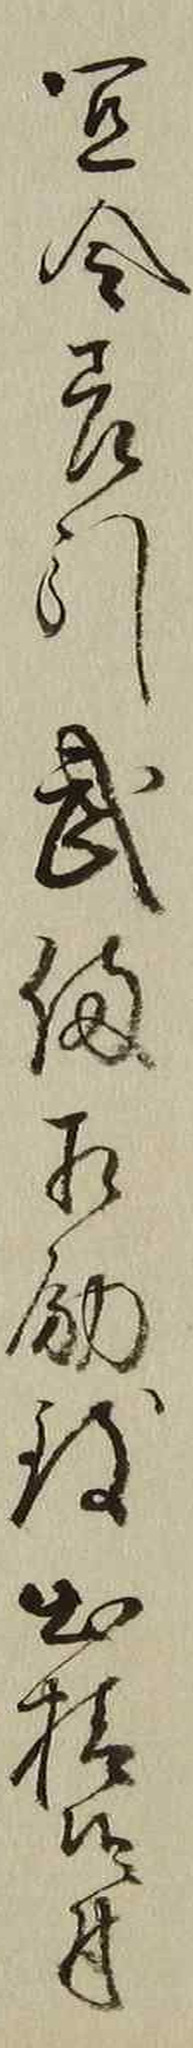宜令差引武備相励致出精候ニ付
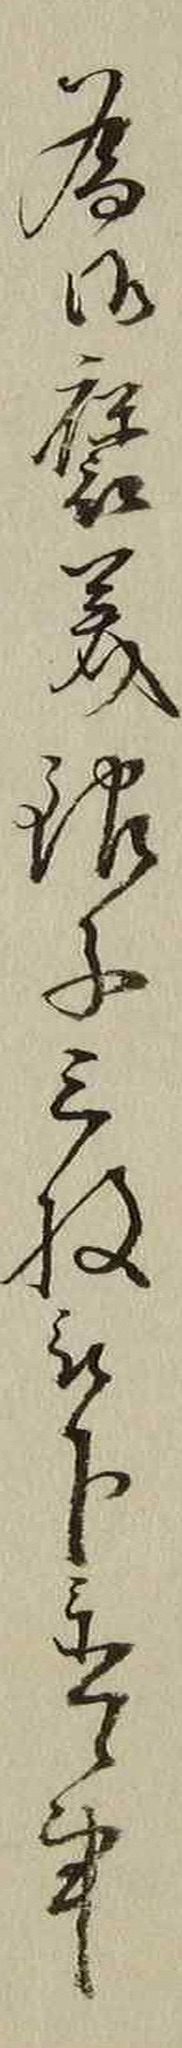為御褒美銀子三枚被下候事
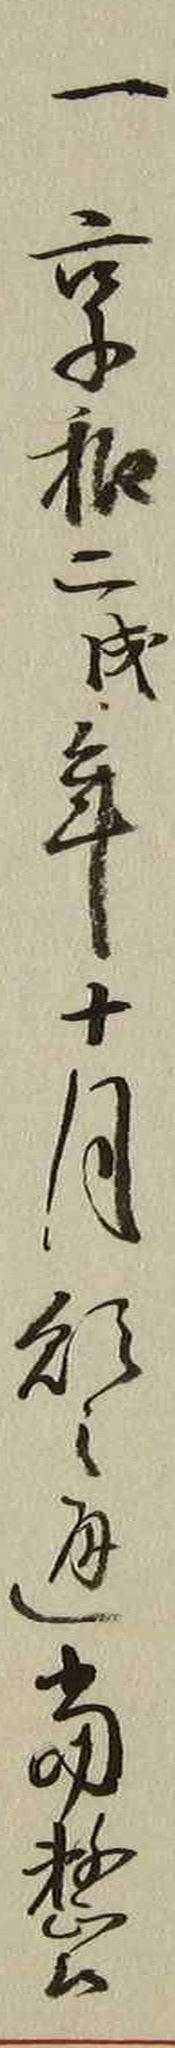一享和二戊年十月願之通当整被
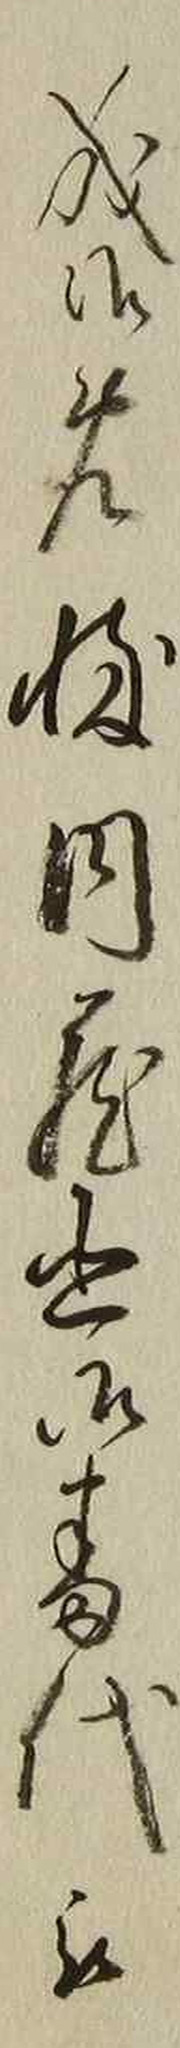成御免悴内蔵丞御番代被
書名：諸士系譜　巻之1　い之部1
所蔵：会津若松市立会津図書館
